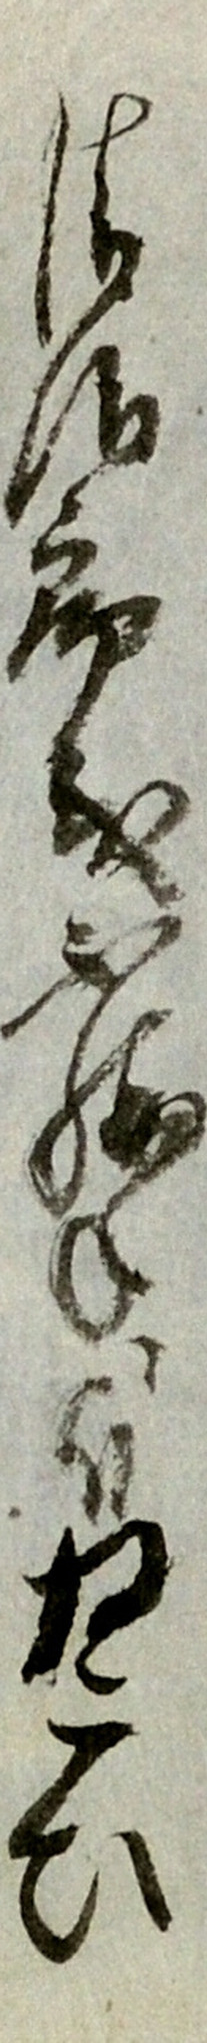清治郎義不勝手ニ付ゐこひ
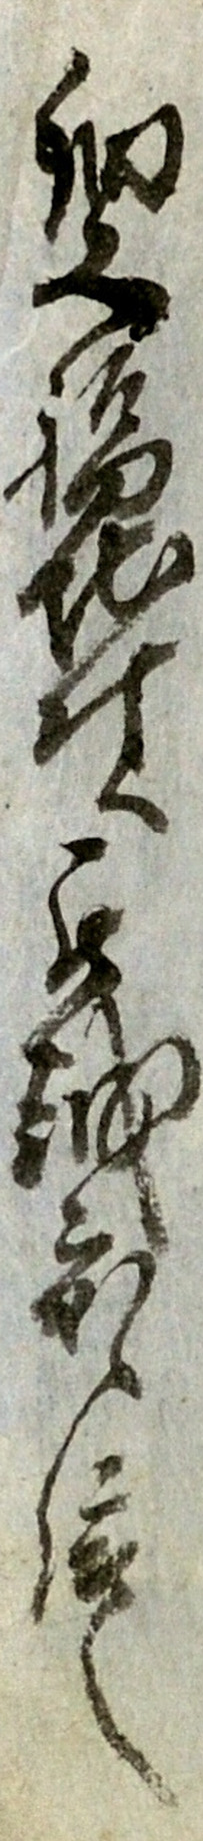細工福地村へ罷越度候依之

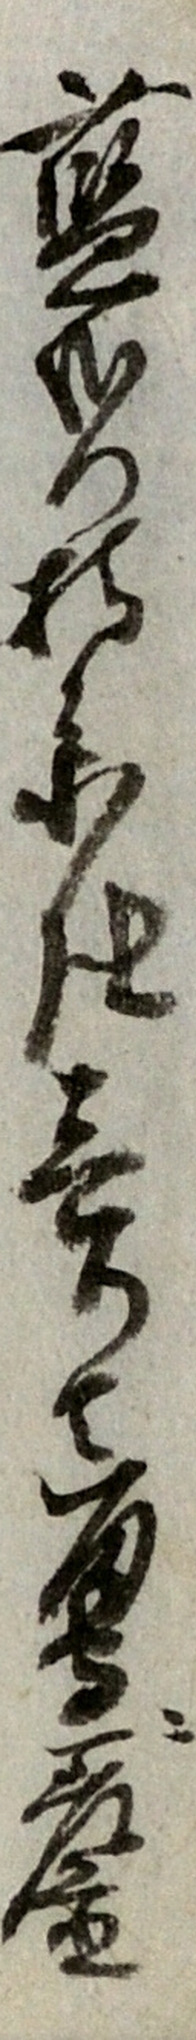藍弐ツ持参仕壱ツは両寺ニ差置
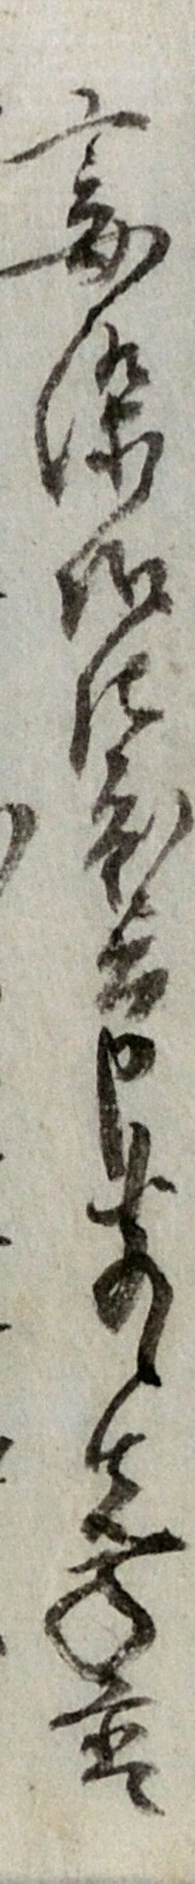妻染御仕度旨申聞候先年置候
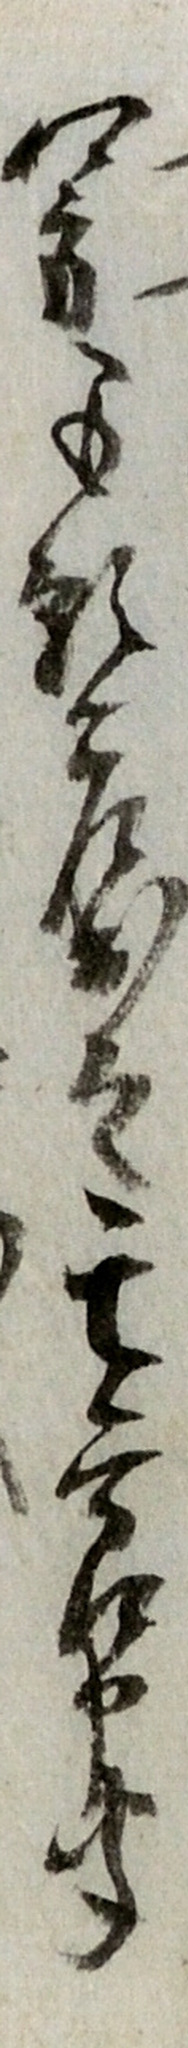郷方へも願差出候ハヽ其節申聞
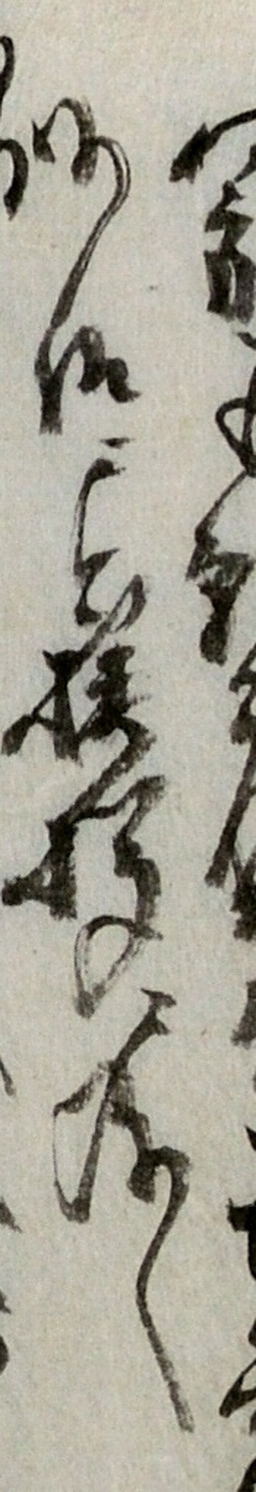何様ニて挨拶に御及候
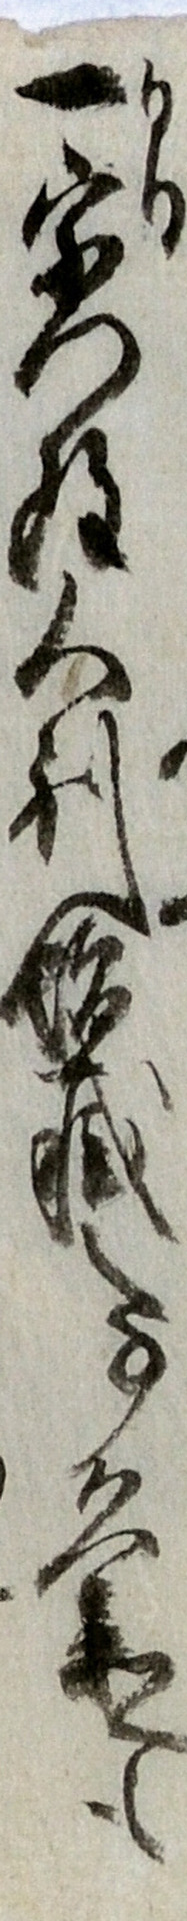一宗門改人別増減之事久兵衛へも
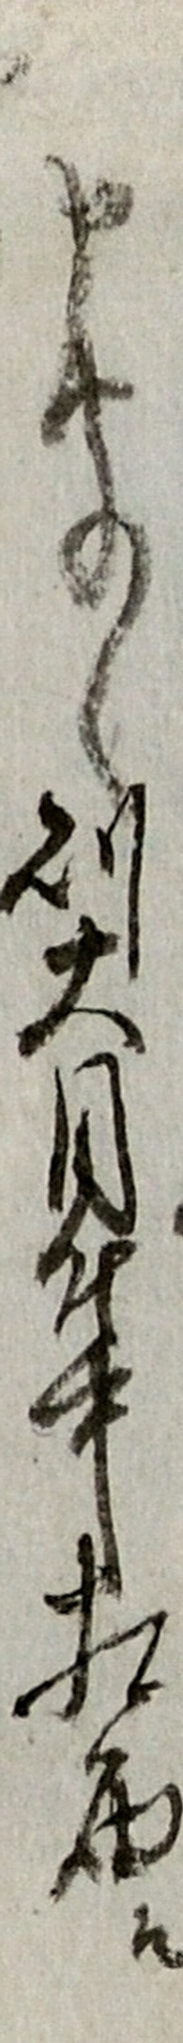申聞候則大目付中相届ル
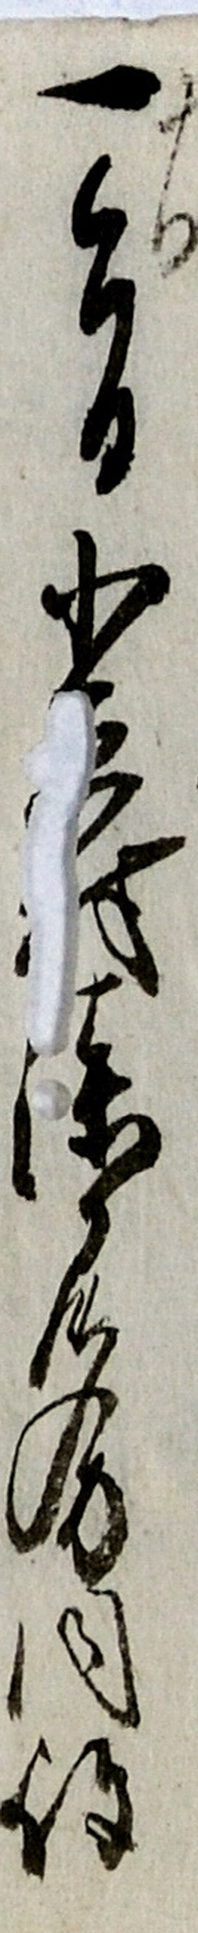一今日小原村漆名分同役
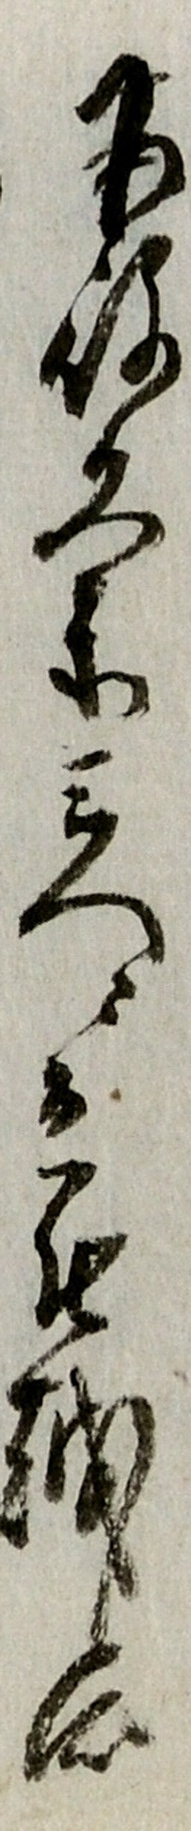下役久兵衛三人ニ而罷越候所
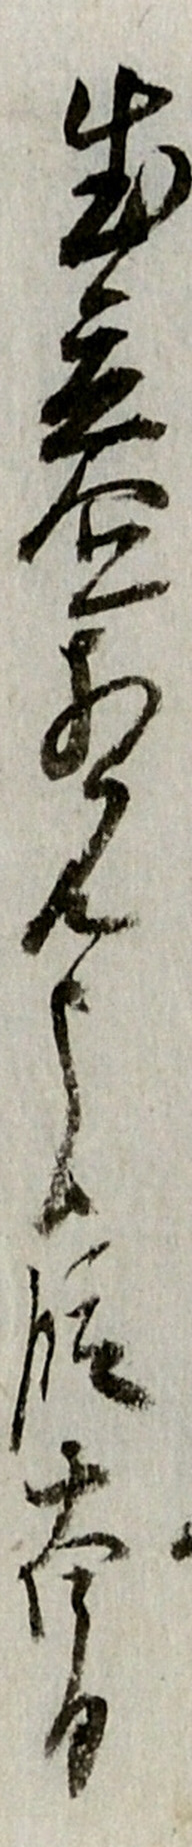成立合相見申候段十四日
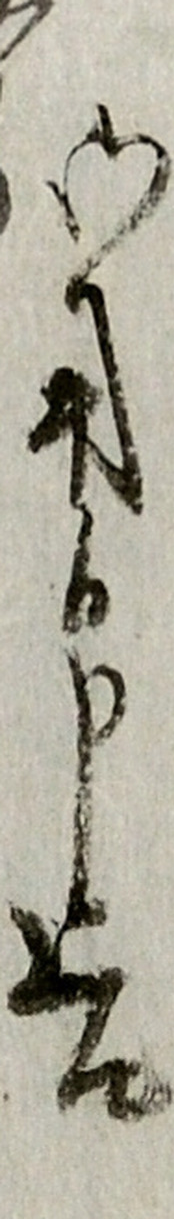御用江申上候
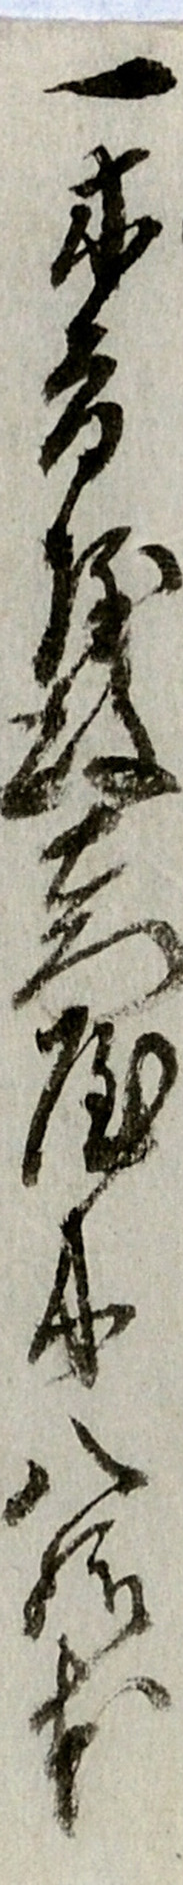一木曽屋政右衛門屋木八拾本
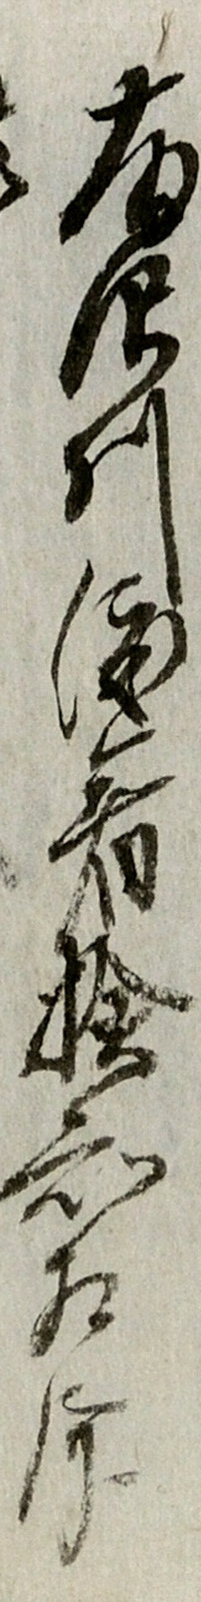藤沢川渡着検知相済
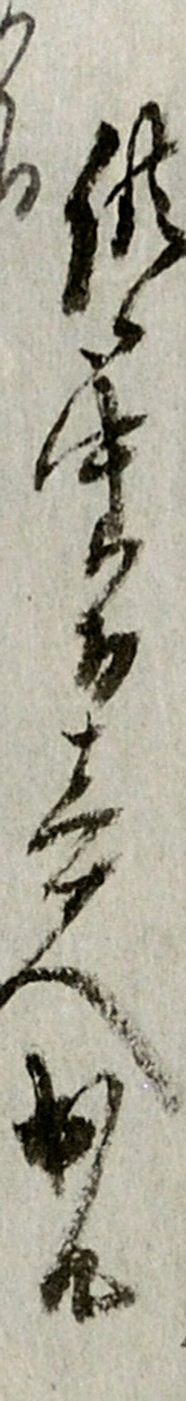供御中間壱人出ル
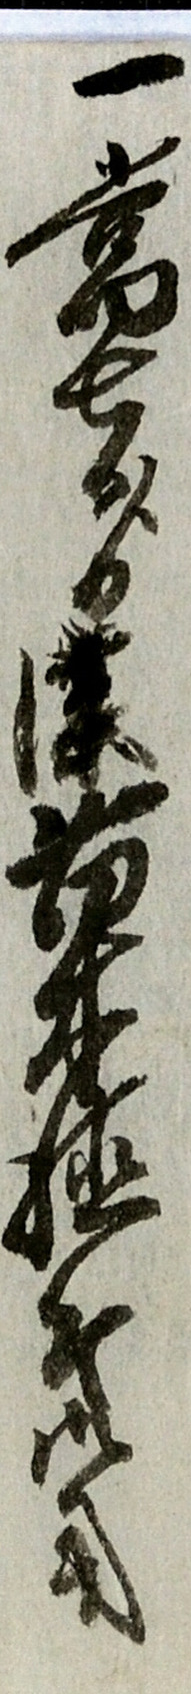一当七日ゟ漆苗木植付御用
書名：分一方諸事御用留帳
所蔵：伊那市立高遠町図書館・合同会社AMANE
